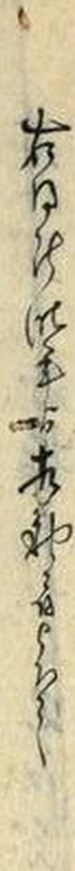右同断昨年ゟ相勤候ニ付被下之

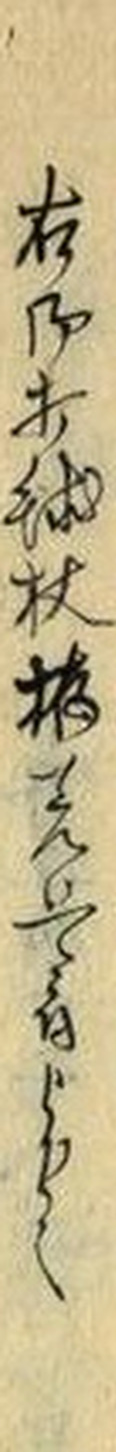右御打毬杖拵差上候ニ付被下之
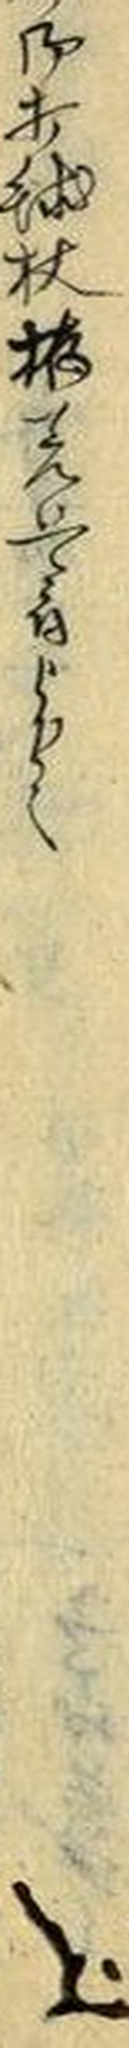右御打毬杖拵差上候ニ付被下之
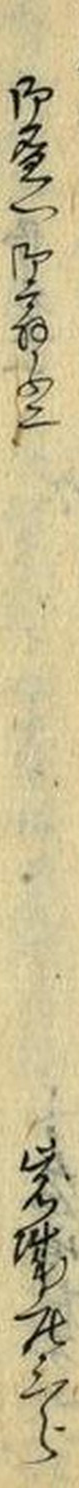御盃一御扇子二岩城庄三郎
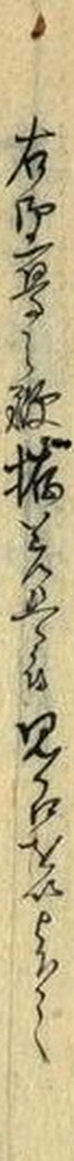右御鷹之鞭拵差上候ニ付思召を以被下之
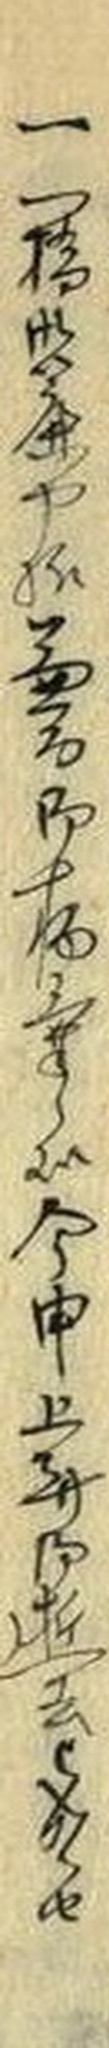一一橋御簾中様兼而御病気候処今申上刻御逝去被成候由
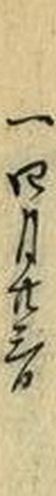一四月廿三日
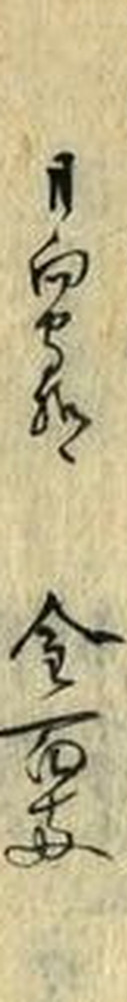日向守様へ金百両
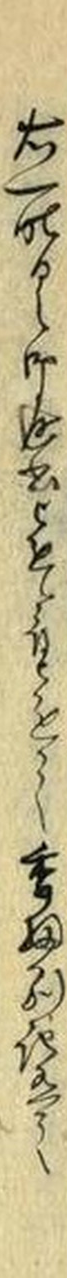右一昨日之御返書被進候ニ付被進之委細別記有之
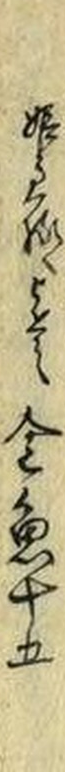姫君様へ被進之金魚十五
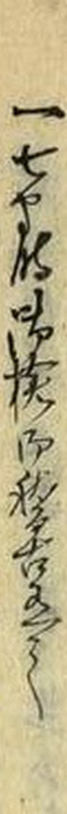一七半時御槍御稽古有之
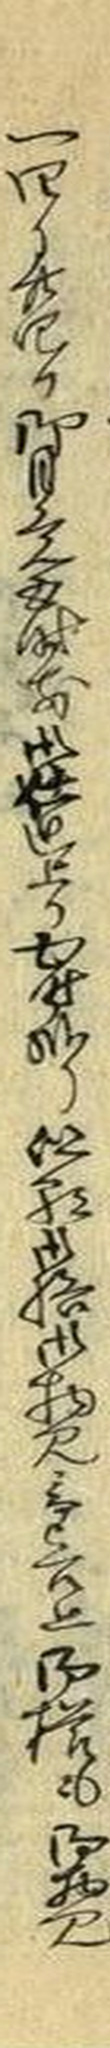一四月廿四日御目覚五時前御仕廻上り五時掛り但朝御膳御物見ニ而被召上御櫛も御物見
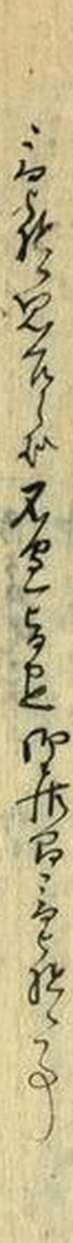ニ而被遊候思召候処不宜旨申上御居間ニ而被遊候事
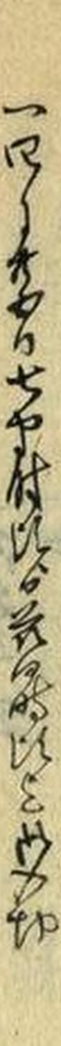一四月廿五日七半時頃ゟ暮時頃迄御〆切
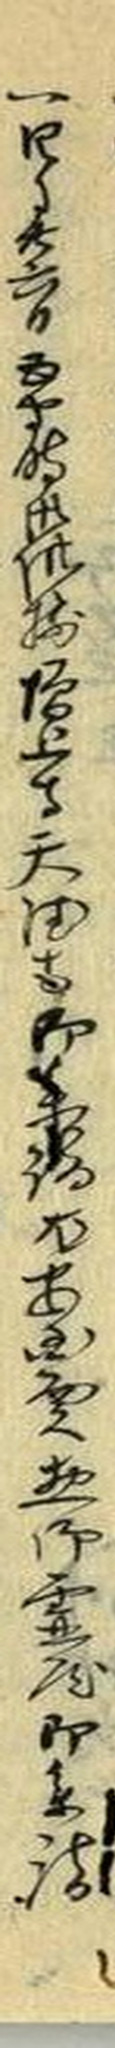一四月廿六日五半時御供揃増上寺天徳寺御参詣尤安国殿惣御霊屋御参詣
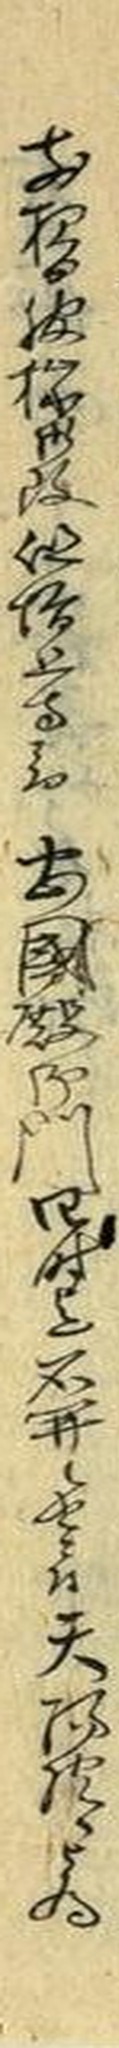前夜ゟ服穢御改但増上寺ニ而安国殿御門四時迄不開候由ニ付天陽院へ被為
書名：少傅日録抄（斉承付側向頭取日記、在府）
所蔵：福井県文書館 Fukui Prefectural Archives
